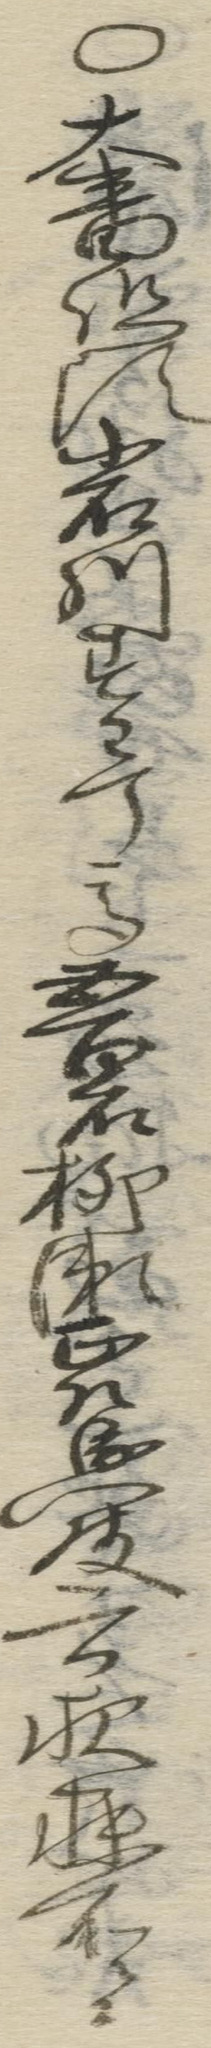○大番組頭小石川すわ丁高五百石柳瀬正左衛門殿二日夜寝所ニ而
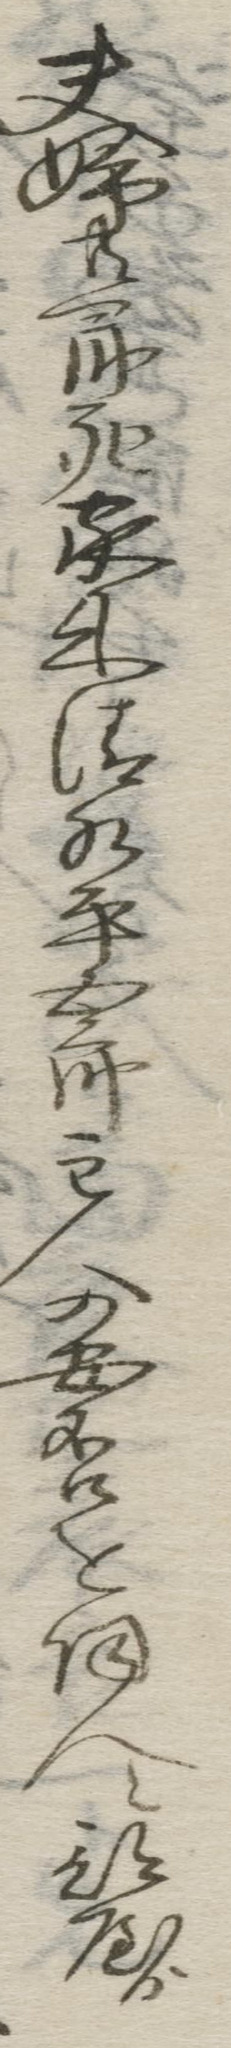夫婦共即死家来清水平五郎主人の安否を伺んと部屋ゟ
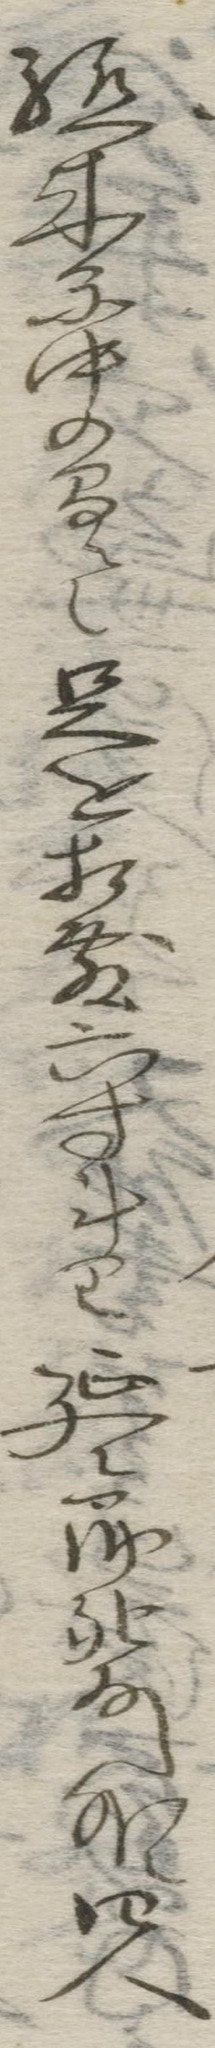駈来るに中の間にて足を相敷六寸斗り延て即死なり外に四人
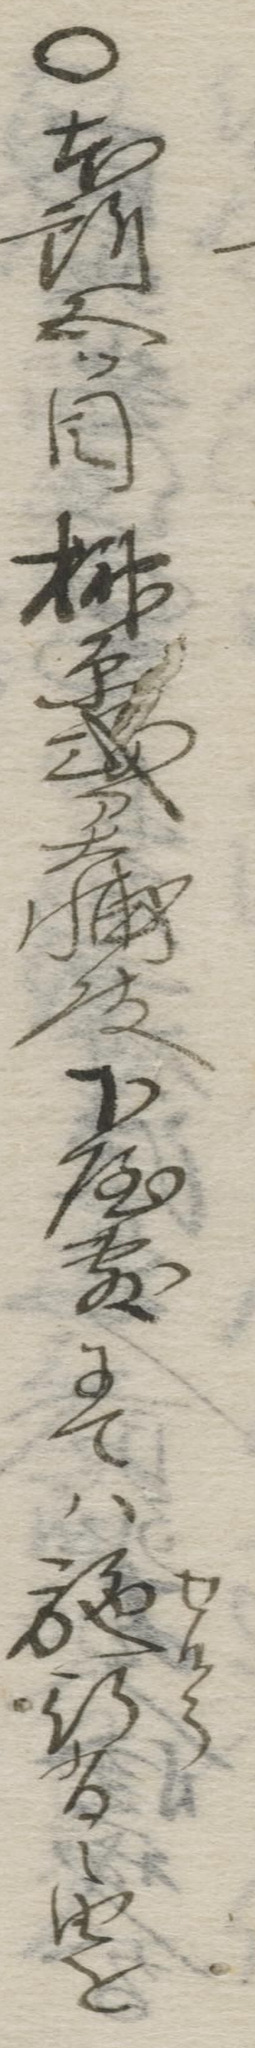○本所五ツ目榊原式部大輔殿下屋敷にてハ施行有之由を
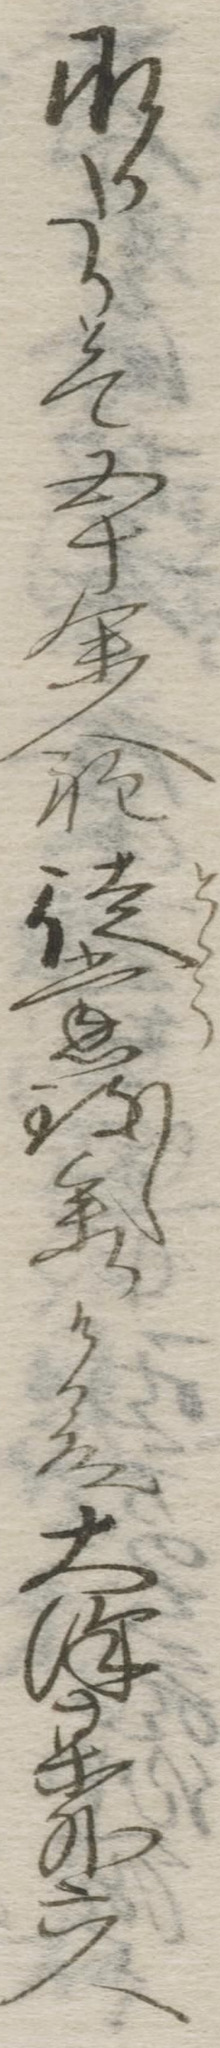承りたるとて五十余人程徒党致し参りける故大澤某外六人
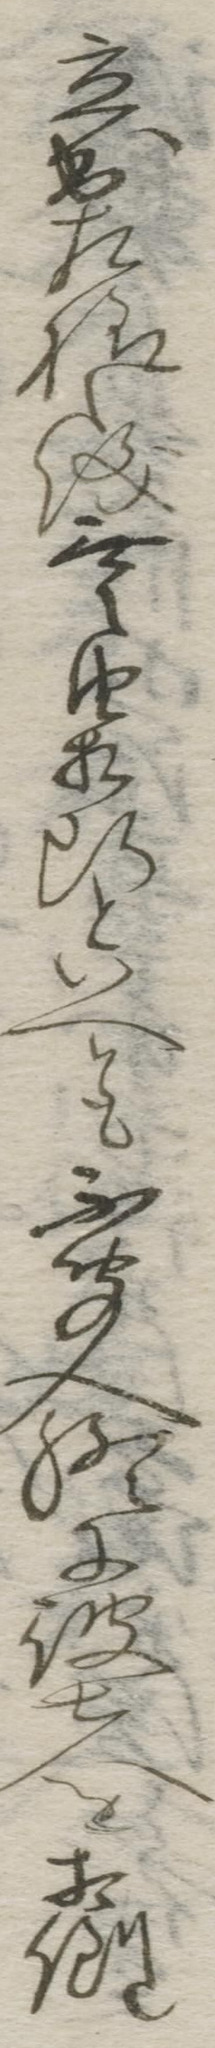立出左様の儀無之由相断といへとも不聞入終に彼七人を相倒し
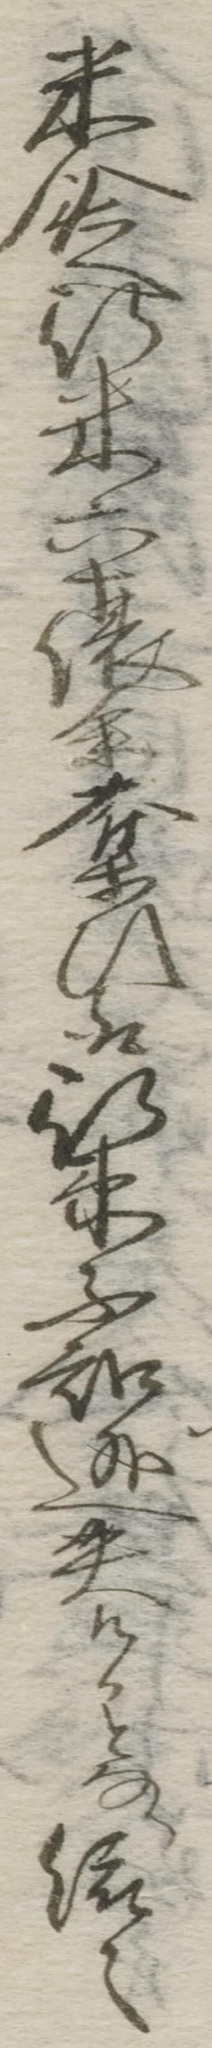米倉へ行米六十俵余奪ひ取行衛不知逃失けりとなり依之
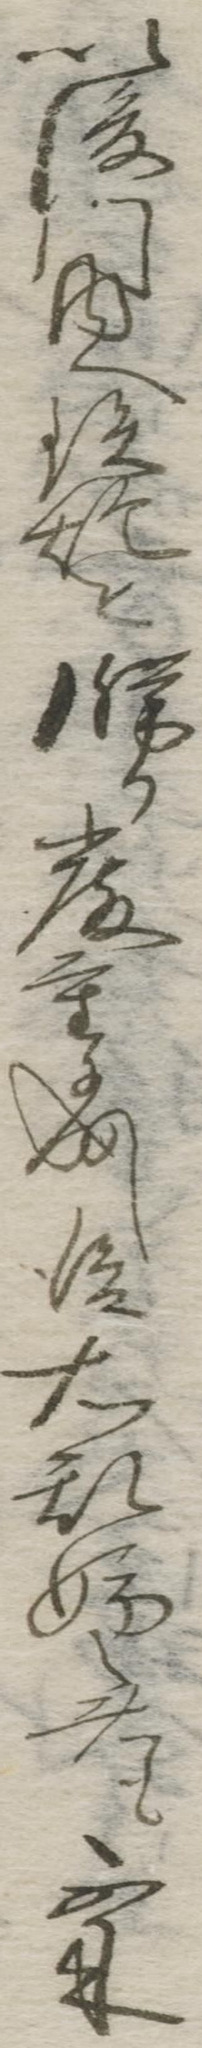以後門内へ鉄炮を飾り厳重に成し後右乱妨之者も不来
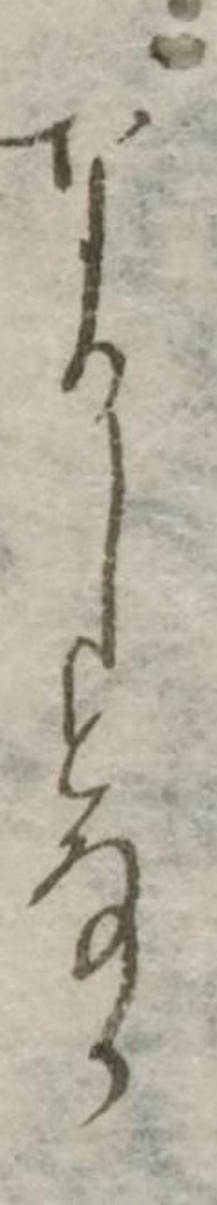なりしとなり
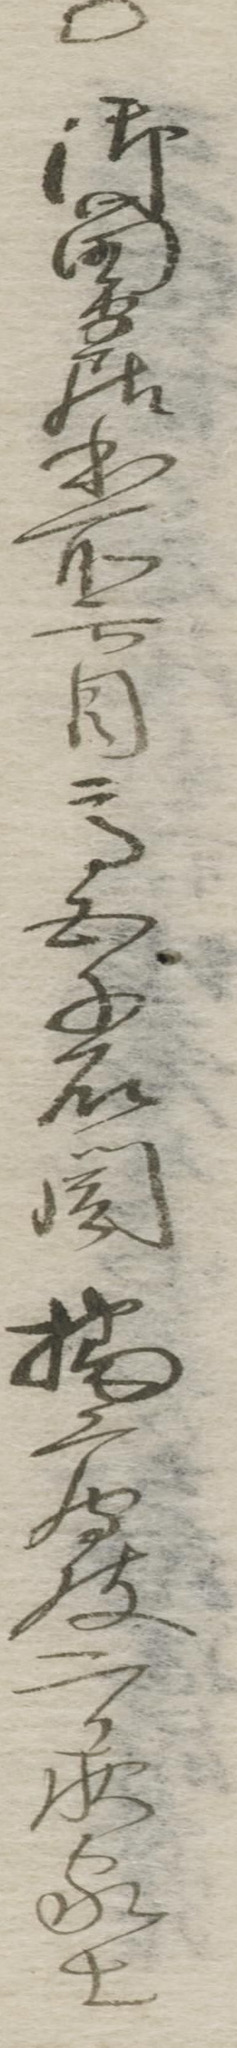○御留守居本所二ツ目高五千石関播磨守殿二日夜家士

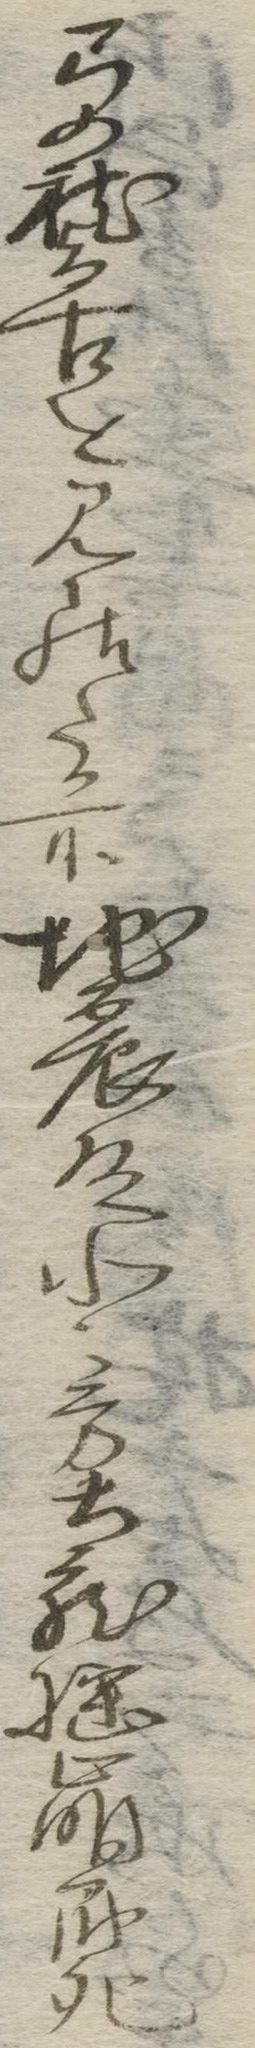弓の稽古を見居たる所地震北之方土蔵揺崩即死
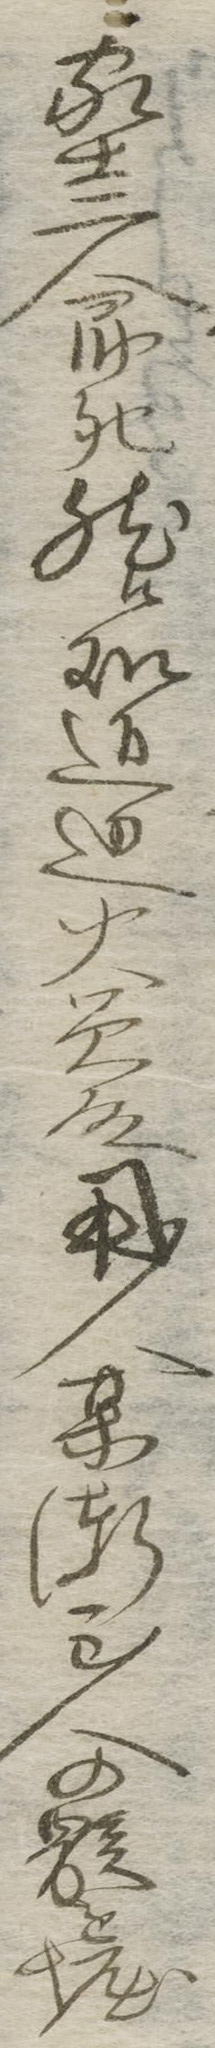家士三人即死然ル処近辺火災故用人某漸主人の骸を堀
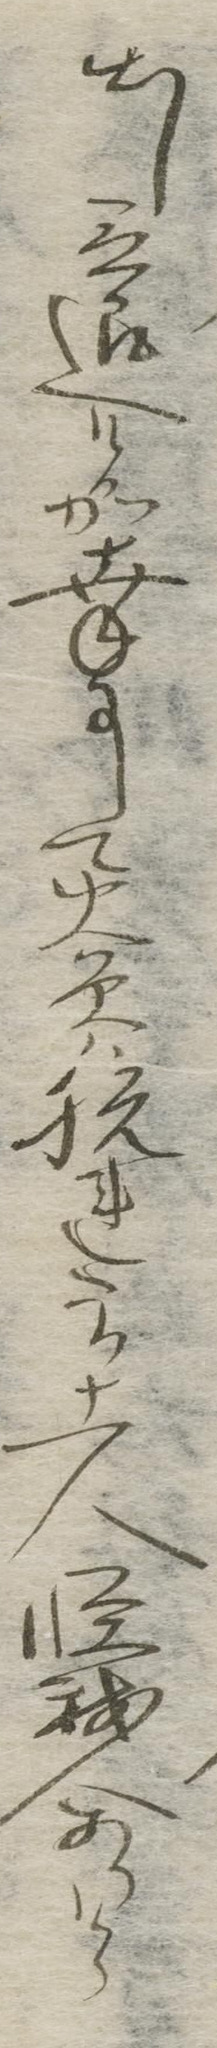出し立退けるか幸にして火災ハ脱れたり十一人怪我人ありけり
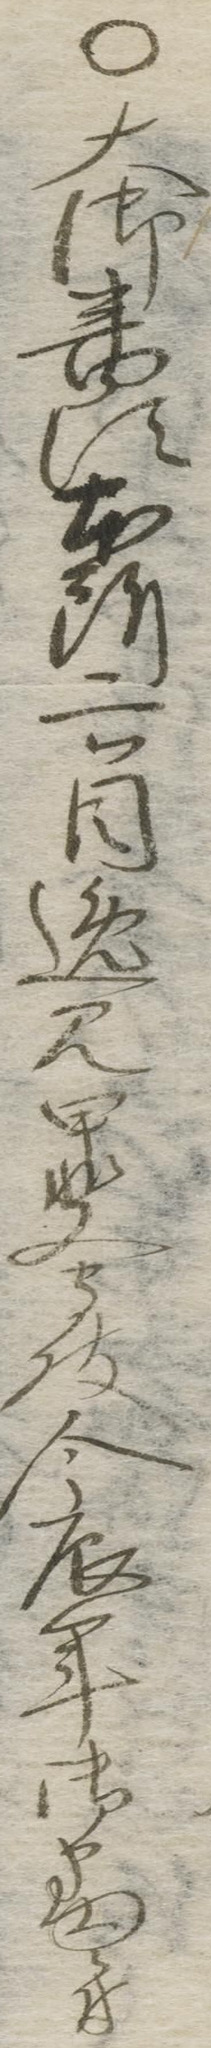○大御番頭本所二ツ目逸見甲斐守殿今辰年御番ニ付
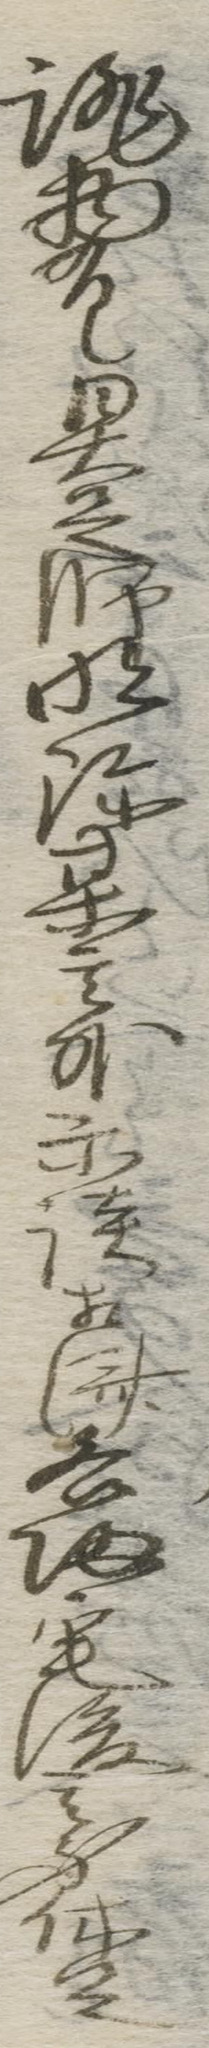誂物有之具足師明珎某其外示談相済各帰宅後其身休足
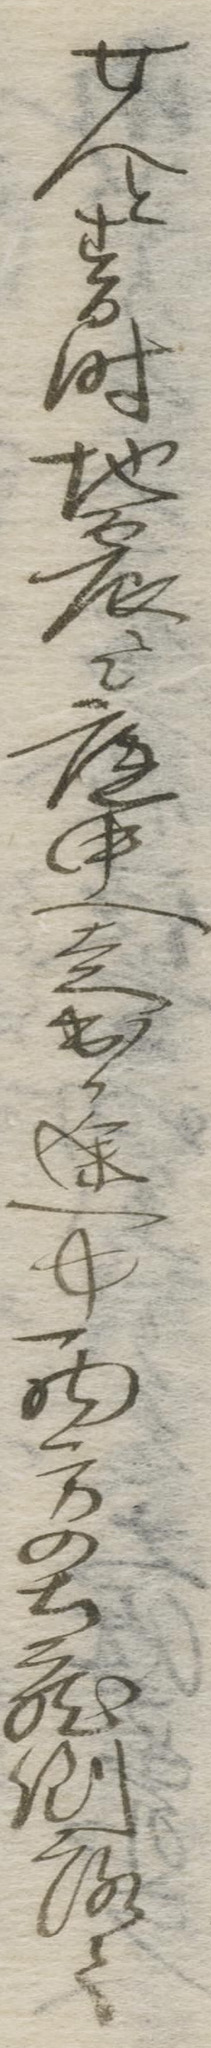せんとする時地震ニて庭中へ走出る途中西方の土蔵倒落て
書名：江戸中諸屋敷　地震竒談録
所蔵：東京大学地震研究所図書室 Earthquake Research Institute Library, The University of Tokyo, JAPAN
